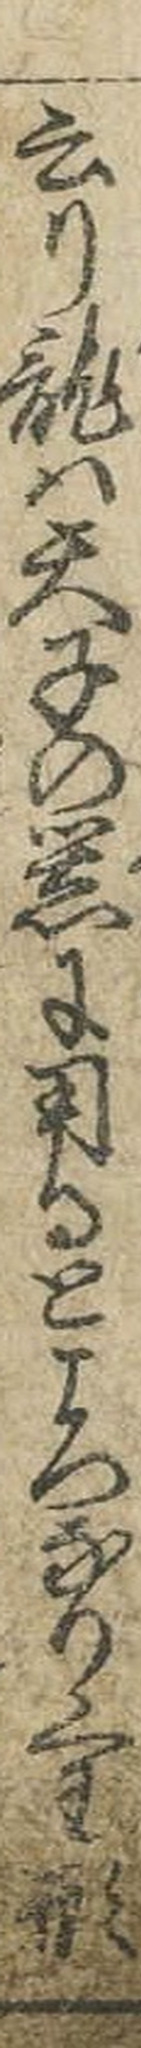云り龍は天子の器に用るところなりくわ形
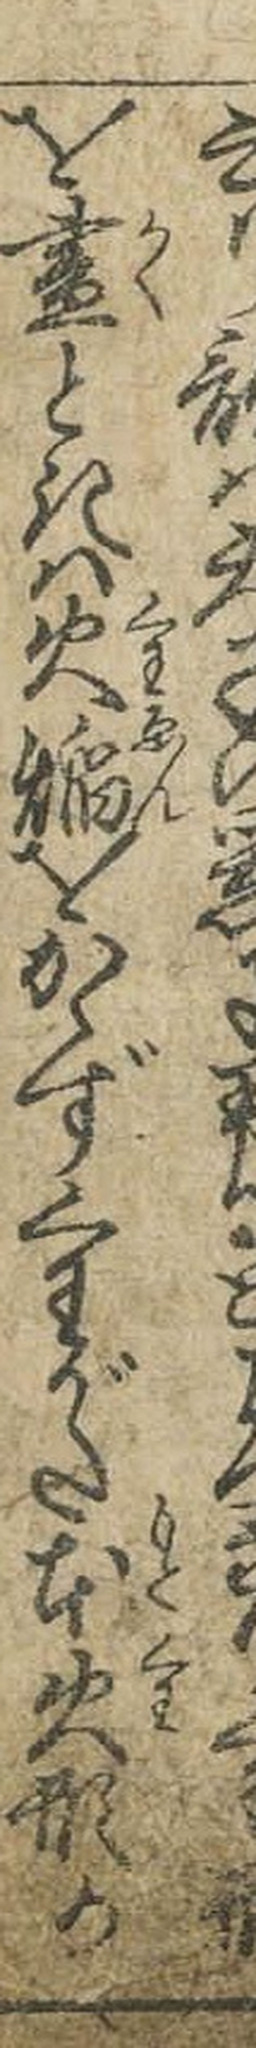を書ときは火焔をかゝずくわがた本火形か

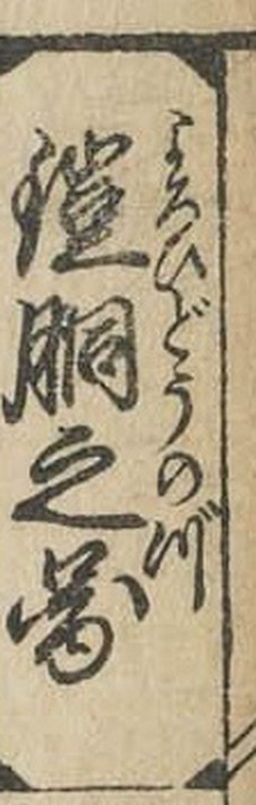鎧胴之図
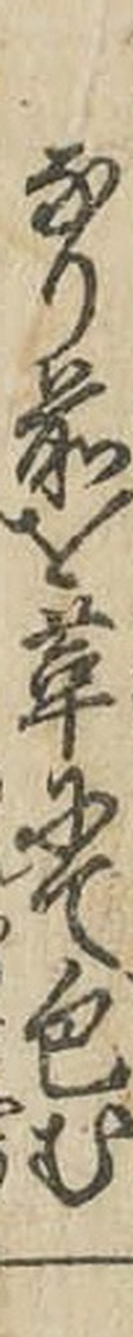なり前を革にて包む
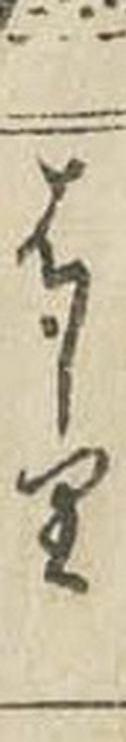はしり
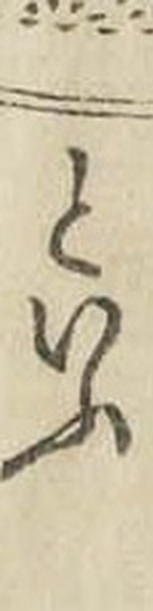といふ
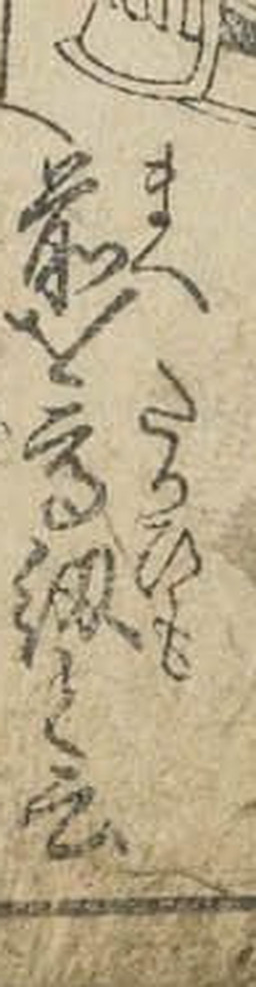前を高紐と云
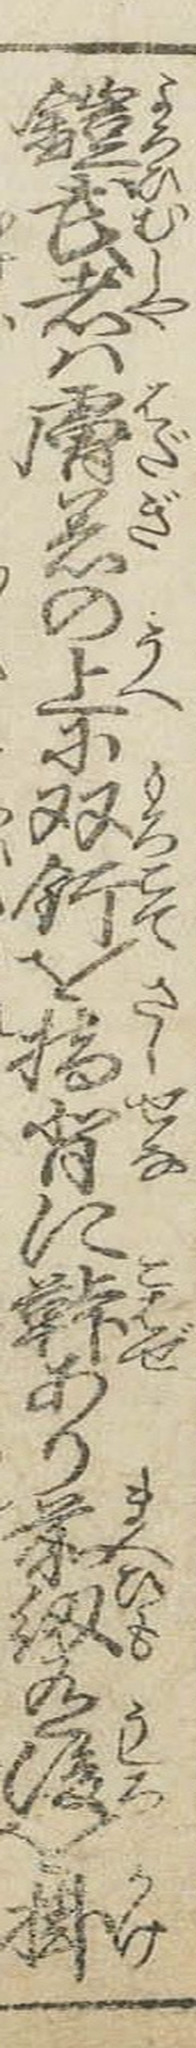筒鎧武者は膚着の上に双釬を指背に鞐あり前紐有後を掛
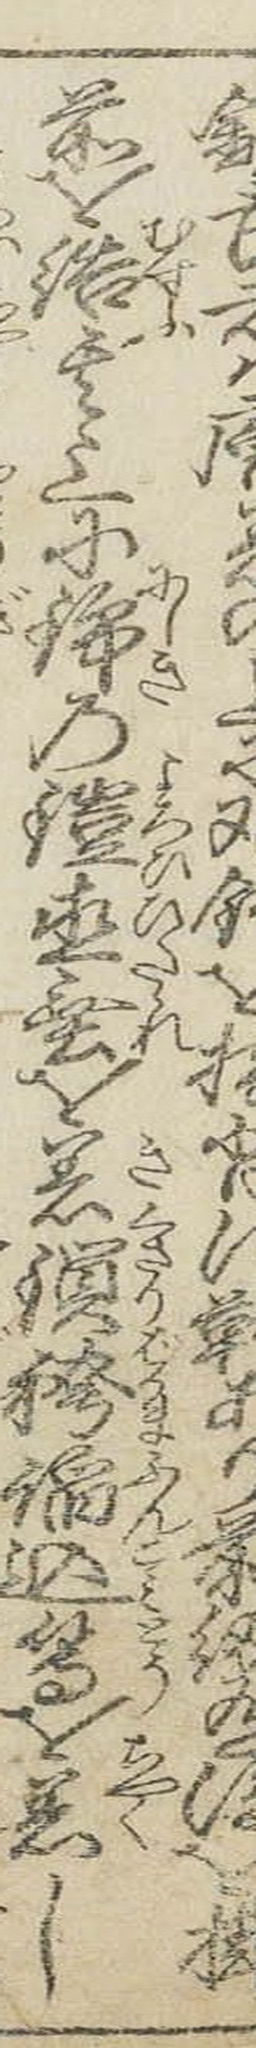釬前を結其上に錦の鎧直垂を着鎖袴蹈込等を着し
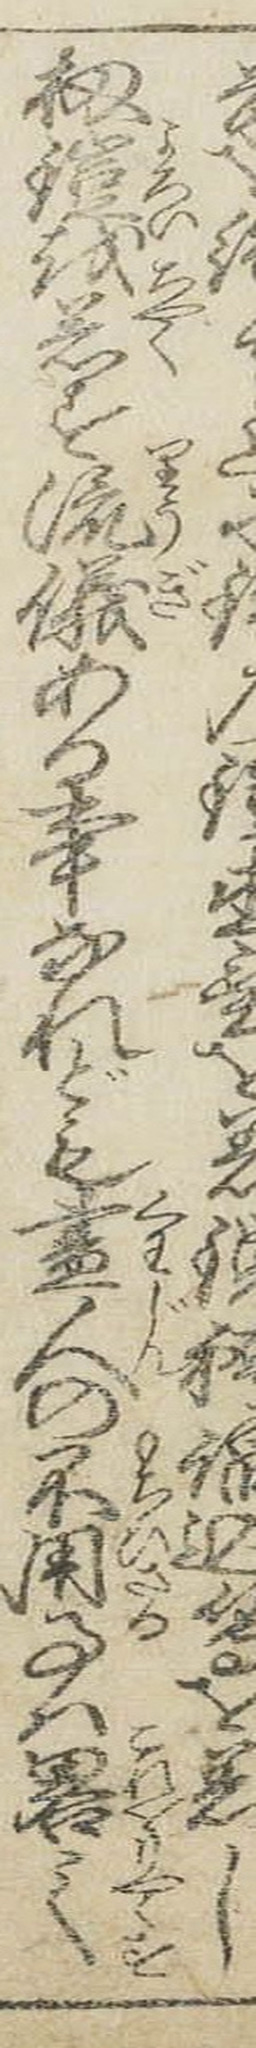扨鎧を着す流儀ある事なれども画人の不用事は略之
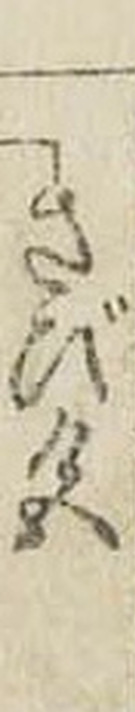さび色
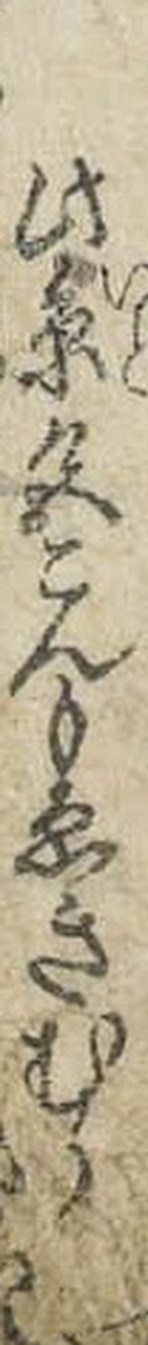筒此糸色こんもゑきむら

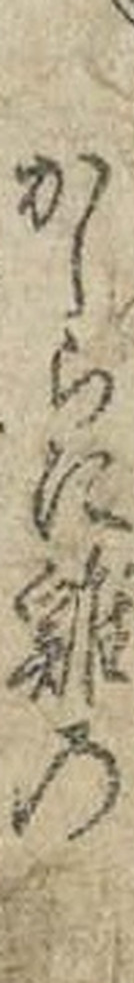かしらに雞の
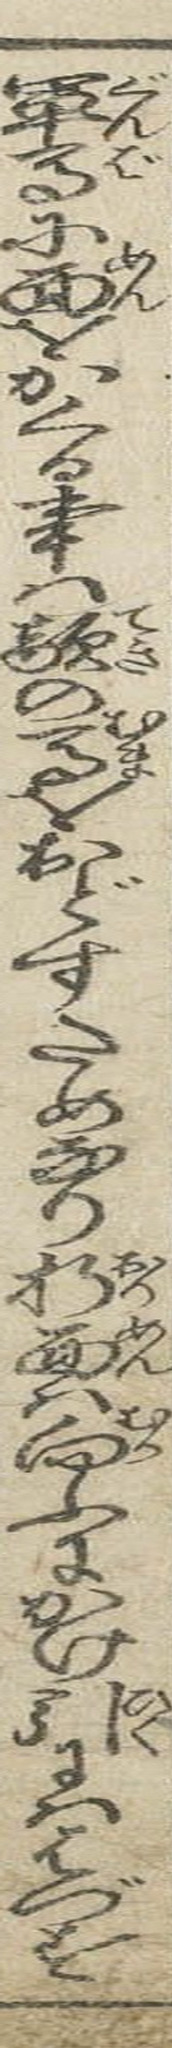軍馬に面をかくる事は敵の馬をおどすためなり折面は向ふにかけ引にははづす
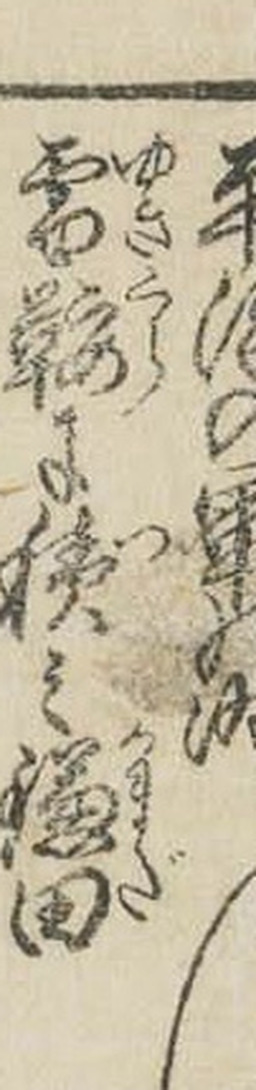雪鞍に積み鎌田
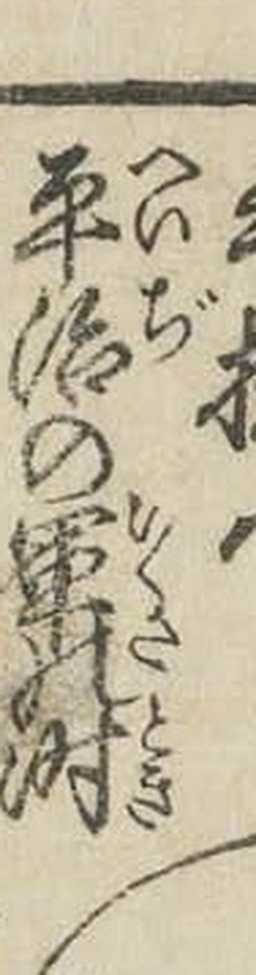平治の軍の時
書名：絵本写宝袋 9巻 2之巻
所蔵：東京学芸大学教育コンテンツアーカイブ
